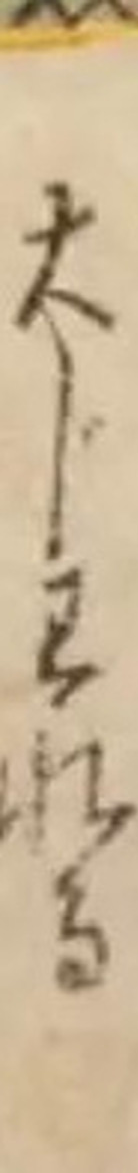大じわれる
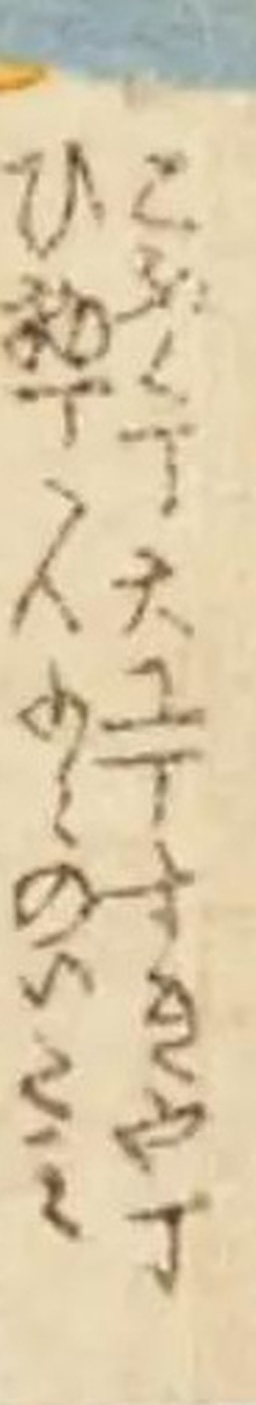ひ物丁へん少々のいたみ
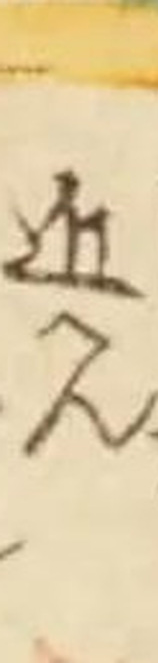近へん
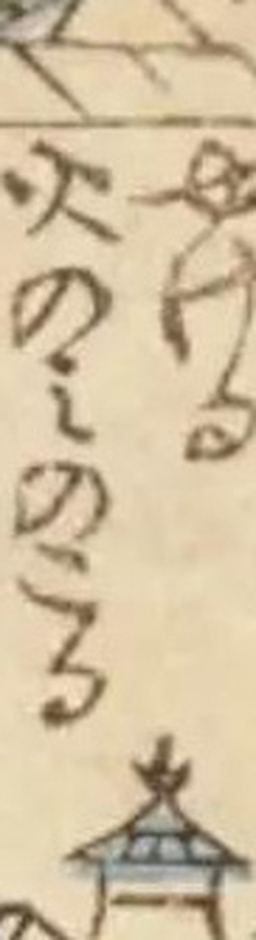火のみのこる
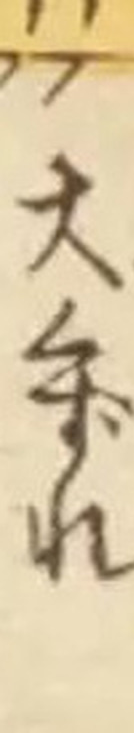大くずれ
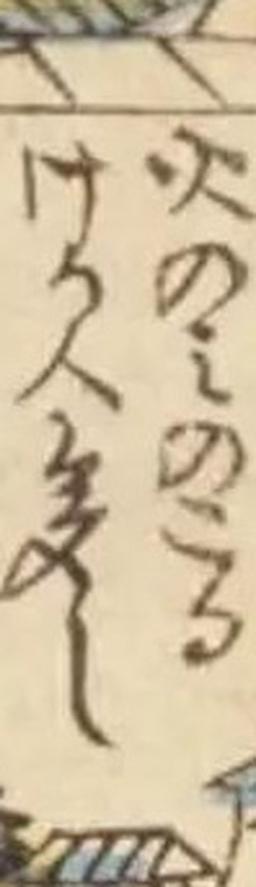けが人多し
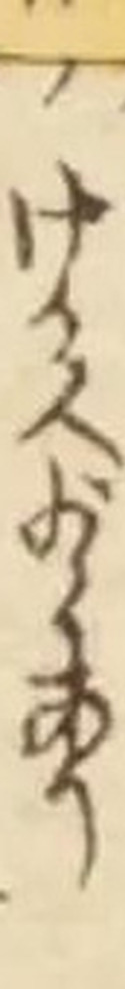けか人少々あり
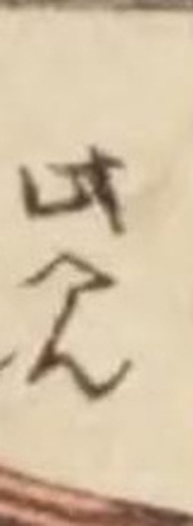此へん
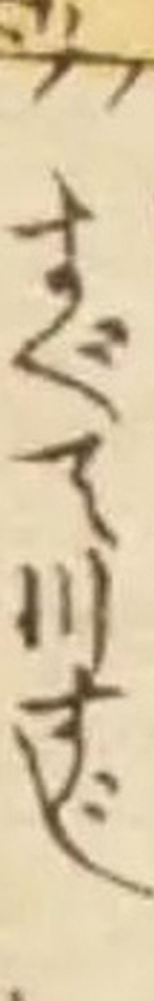すべて川すじ
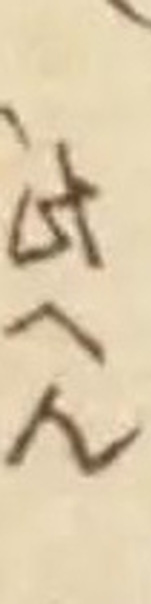此へん
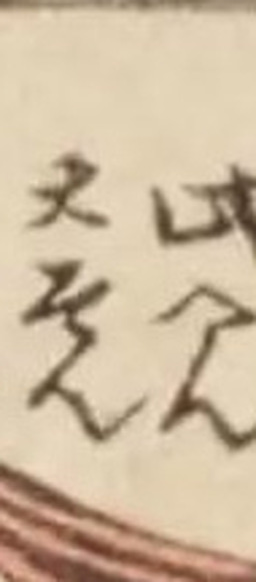大そん
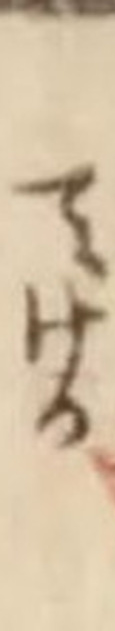やける
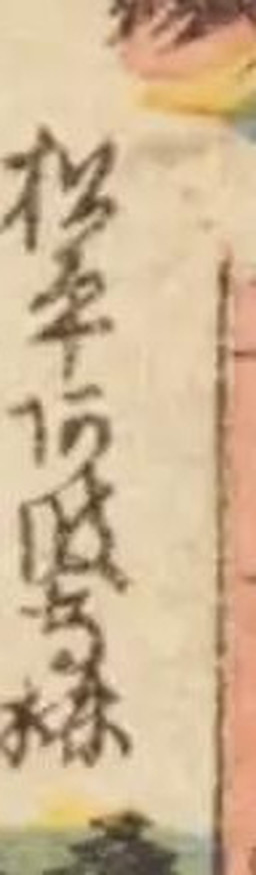松平阿波守様
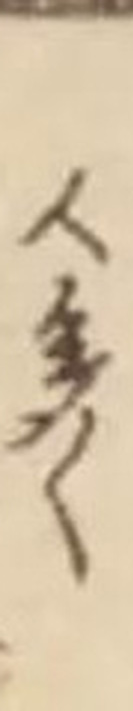人多く
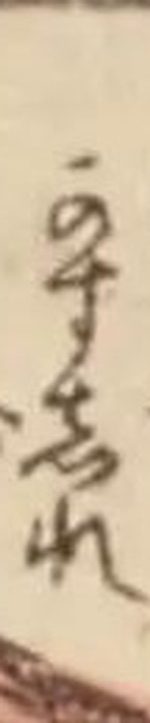かすしれ
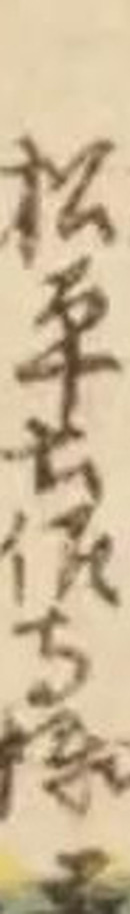松平土佐守様
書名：銘細改板江戸大地震出火場所附
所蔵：国立国会図書館 National Diet Library, JAPAN
